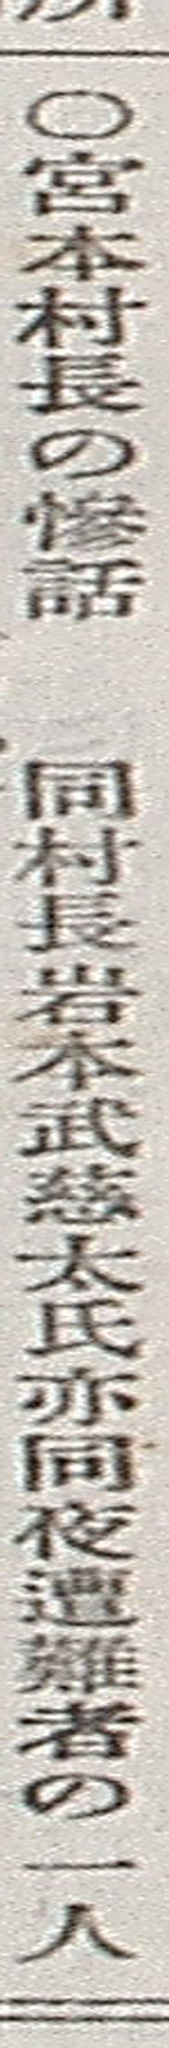○宮本村長の惨話同村長岩本武慈太氏亦同夜遭難者の一人
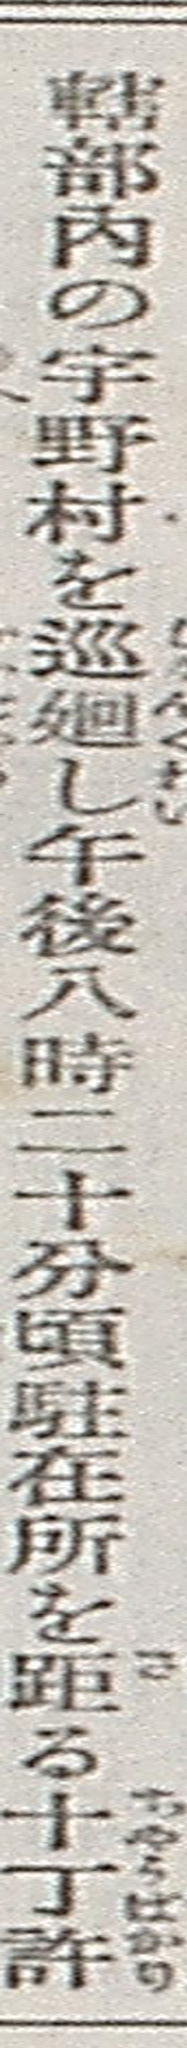轄部内の宇野村を巡廻し午後八時二十分頃駐在所を距る十丁許
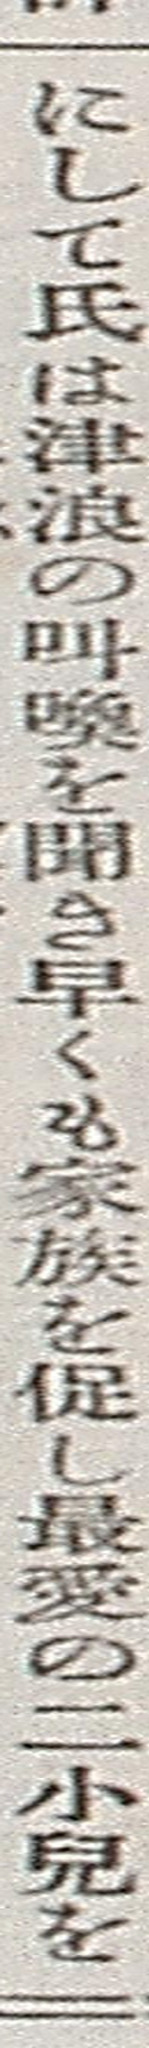にして氏は津浪の叫喚を聞き早くも家族を促し最愛の二小兒を
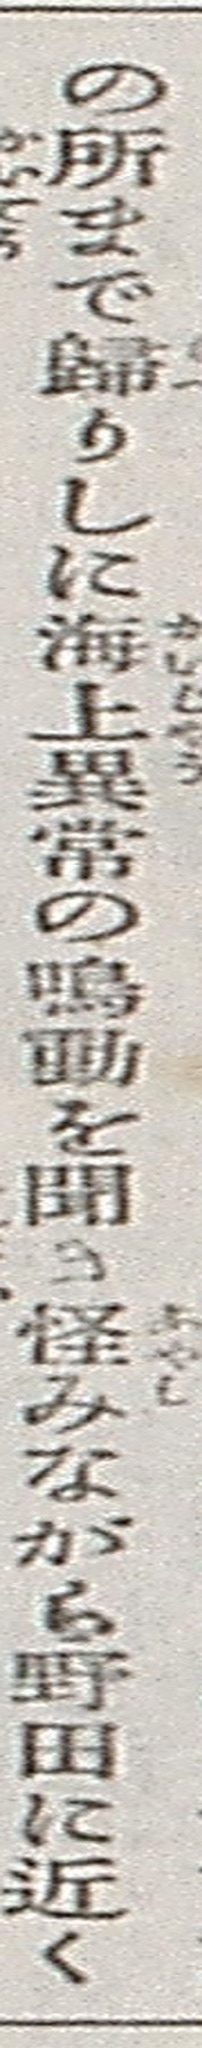の所まで帰りしに海上異常の鳴動を聞き怪みながら野田に近く
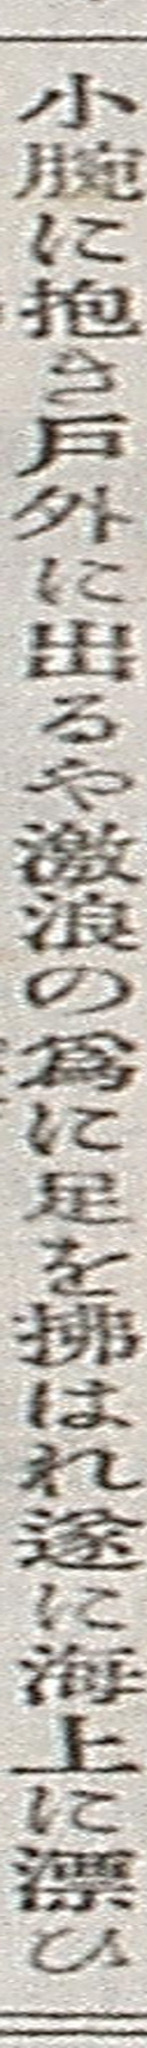小腕に抱き戸外に出るや激浪の為に足を払はれ遂に海上に漂ひ
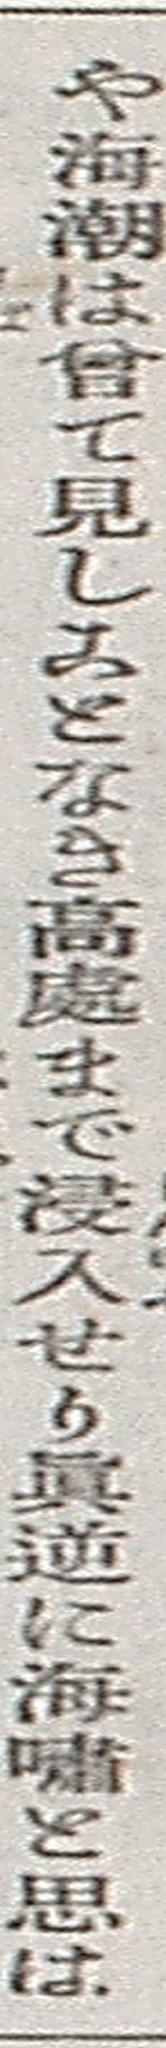や海潮は曾て見しことなき高処まで浸入せり真逆に海嘯と思は
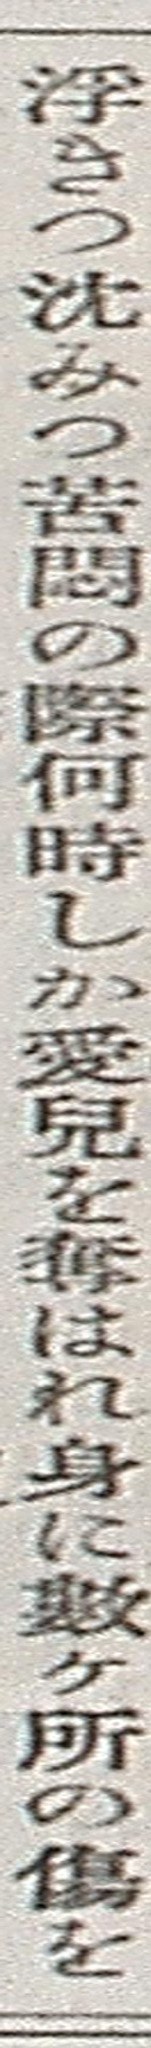浮きつ沈みつ苦悶の際何時しか愛児を奪はれ身に数ヶ所の傷を
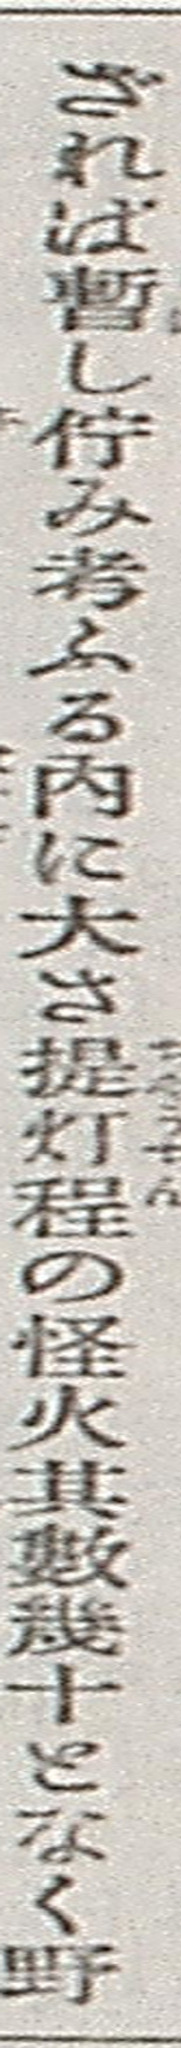ざれば暫し佇み考ふる内に大さ提灯程の怪火其数幾十となく野
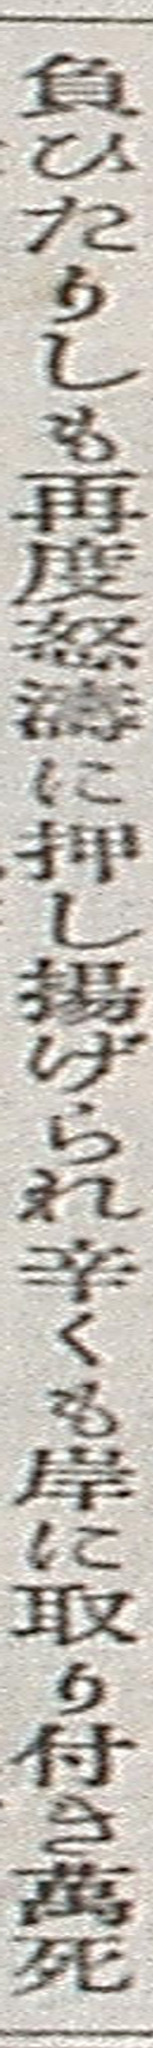負ひたりしも再度怒濤に押し揚げられ辛くも岸に取り付き万死
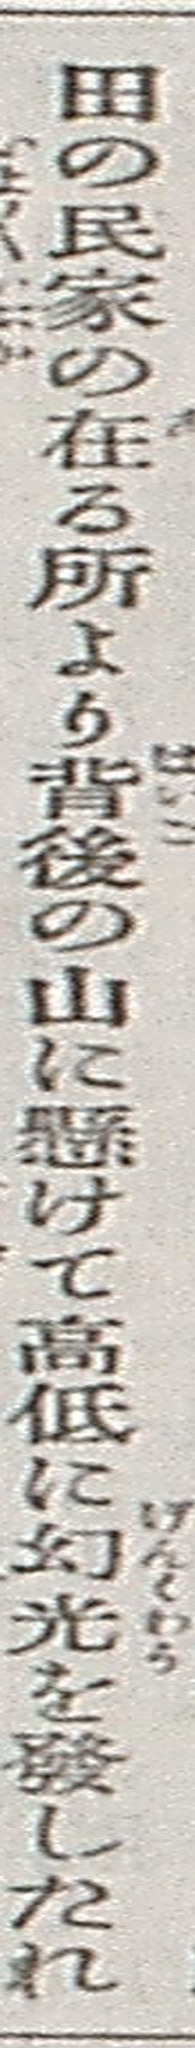田の民家の在る所より背後の山に懸けて高低に幻光を発したれ
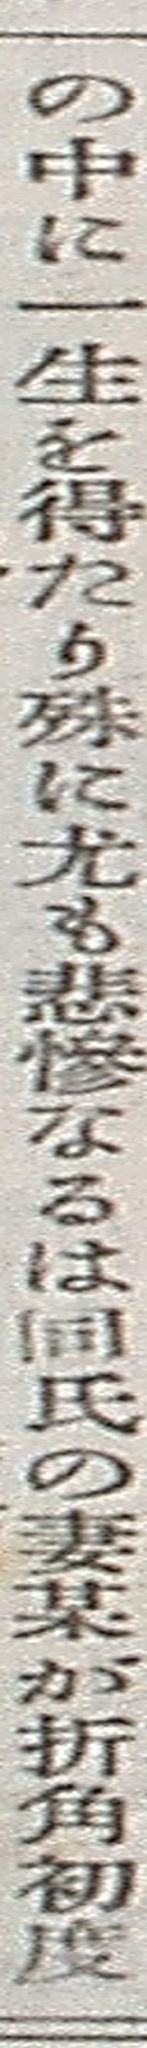の中に一生を得たり殊に尤も悲惨なるは同氏の妻某が折角初度
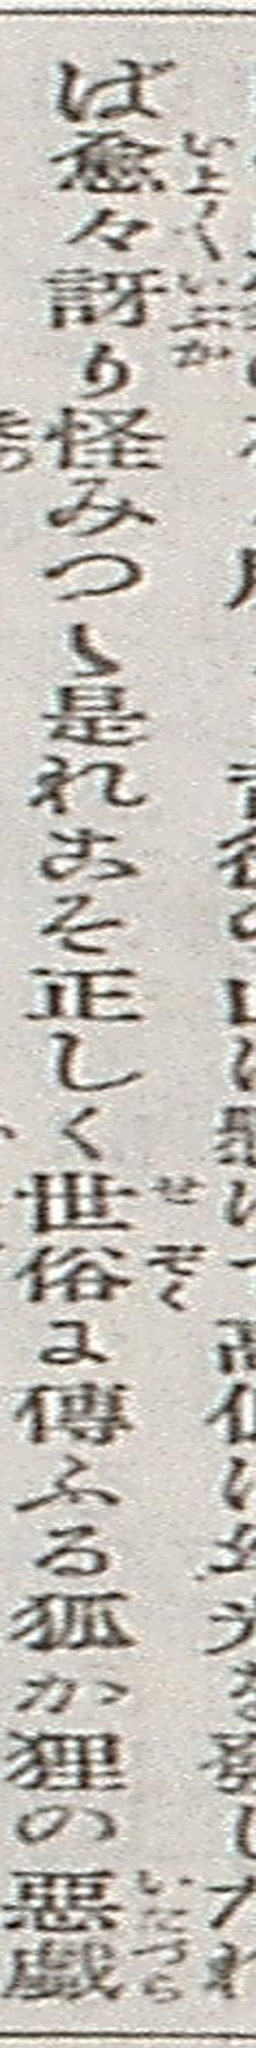ば愈々訝り怪みつゝ是れこそ正しく世俗に伝ふる狐か狸の悪戯
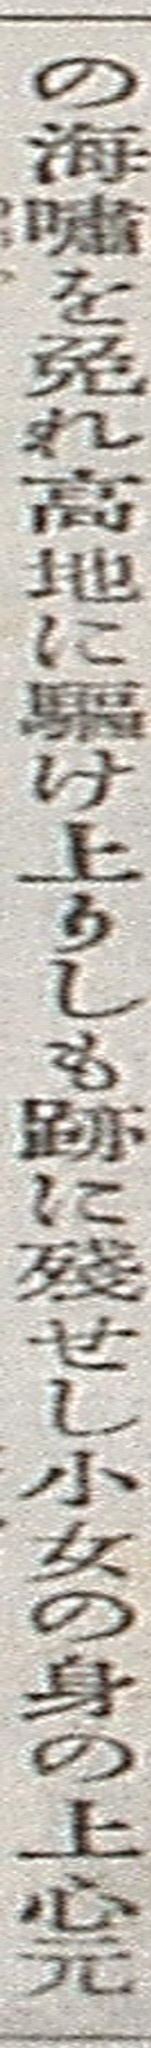の海嘯を免れ高地に駆け上りしも跡に残せし小女の身の上心元
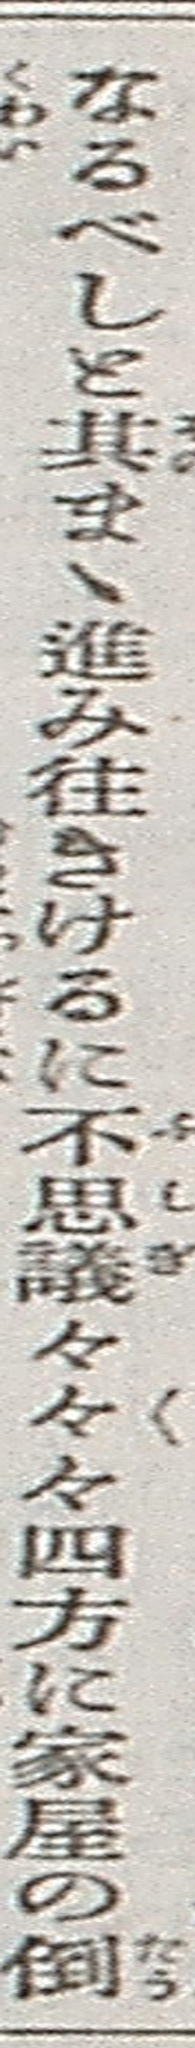なるべしと其まゝ進み往きけるに不思議々々々四方に家屋の倒
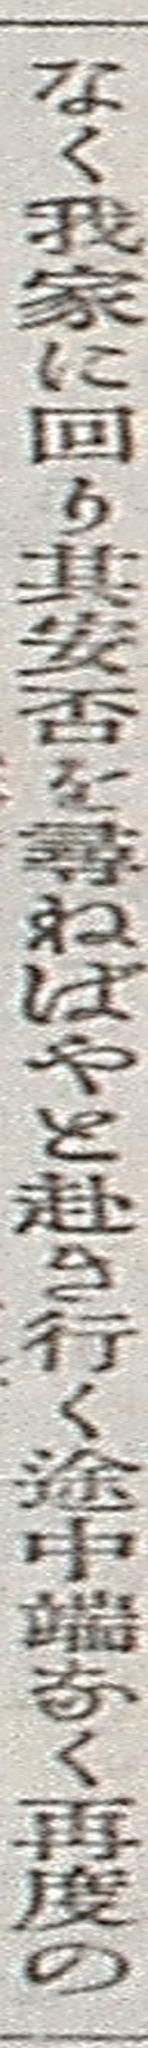なく我家に回り其安否を尋ねばやと赴き行く途中端なく再度の
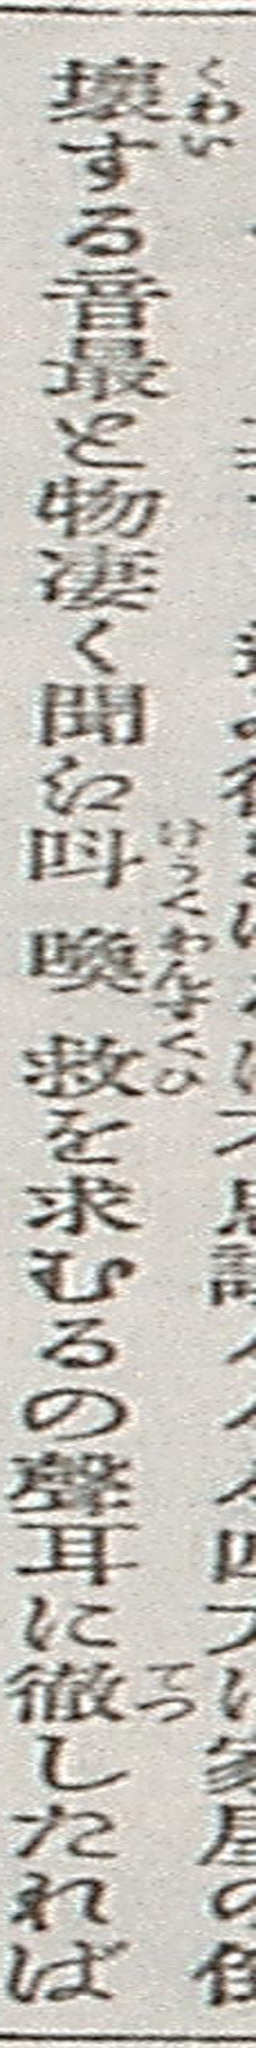壊する音最と物凄く聞え叫喚救を求むるの声耳に徹したれば
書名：風俗畫報臨時増刊第百二十號　大海嘯被害録（下）
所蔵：東京大学地震研究所図書室 Earthquake Research Institute Library, The University of Tokyo, JAPAN
